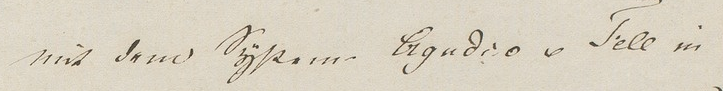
mit dem System Agudio & Fell in
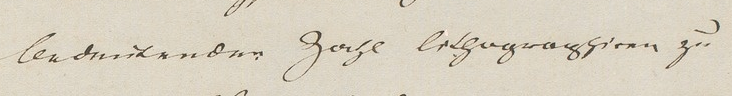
bedeutender Zahl lithographiren zu
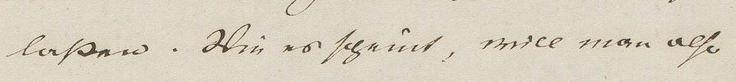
laßen. Wie es scheint, will man also
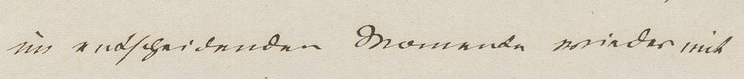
im entscheidenden Momente wieder mit
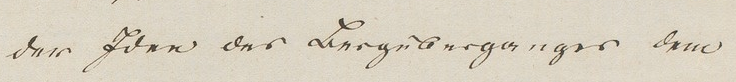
der Idee des Bergüberganges dem
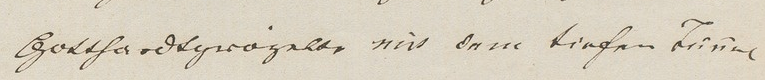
Gotthardtprojekte mit dem tiefen Tunnel
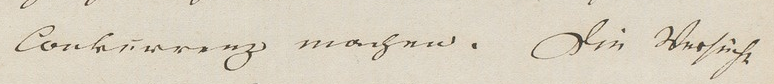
Conkurrenz machen. Die Versuche
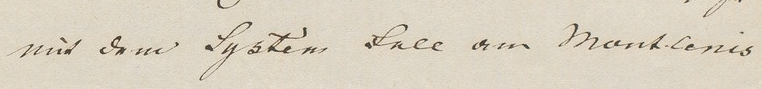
mit dem System Fell am Mont Cenis
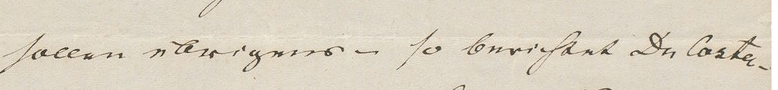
sollen übrigens – so berichtet Du Coster
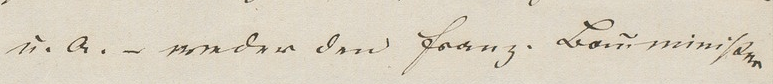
u. A. – weder den franz. Bauminister
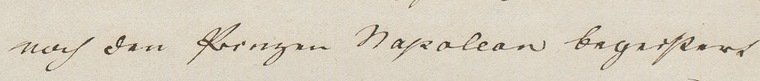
nach den Prinzen Napoleon begeistert
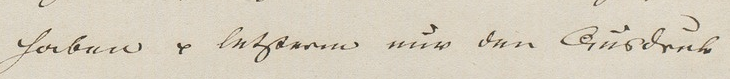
haben & letzterm nur den Ausdruk
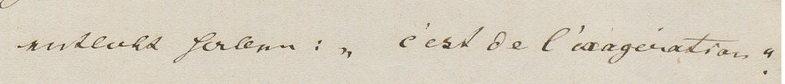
entlokt haben: «c'est de l'exagération».
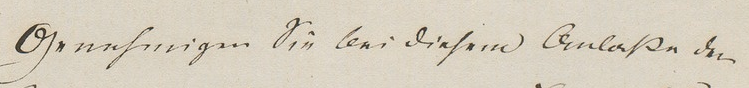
Genehmigen Sie bei diesem Anlaße den
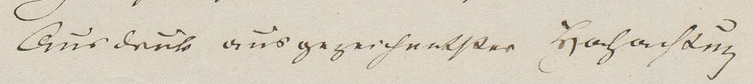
Ausdruk ausgezeichnetster Hochachtung
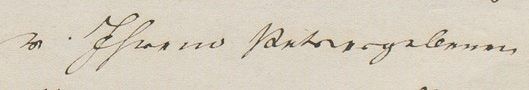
v. Ihrem stets ergebenen
